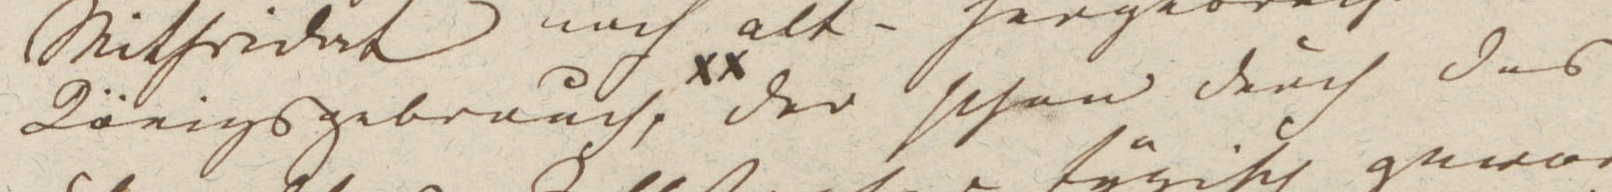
Königsgebrauch, % der schon durch des
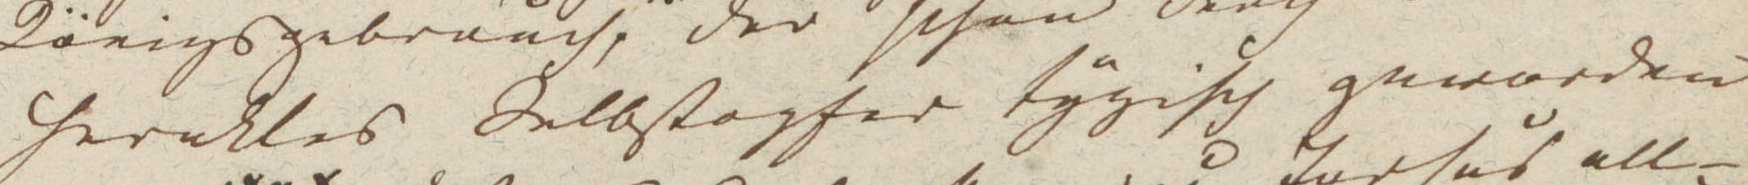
Herakles Selbstopfer typisch geworden
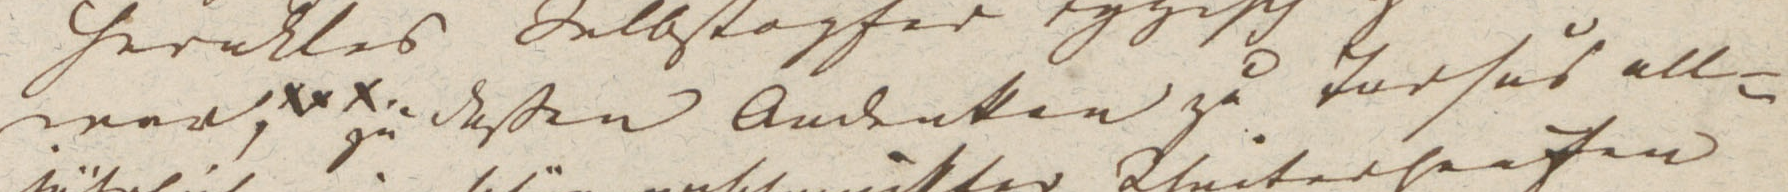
war, % zu dessen Andenken zu Tarsus all-
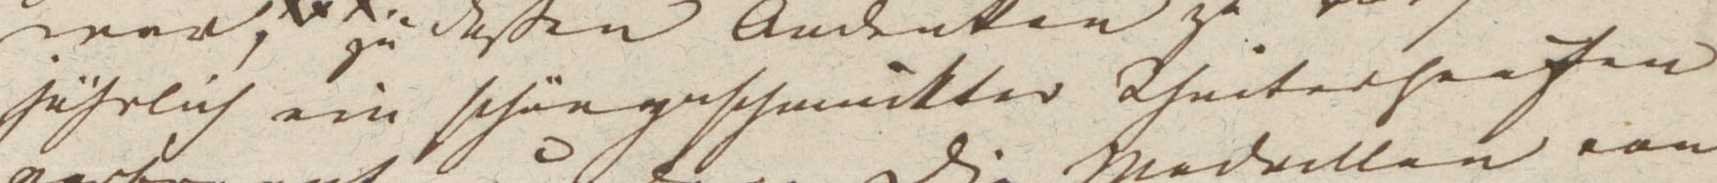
jährlich ein schöngeschmückter Scheiterhaufen
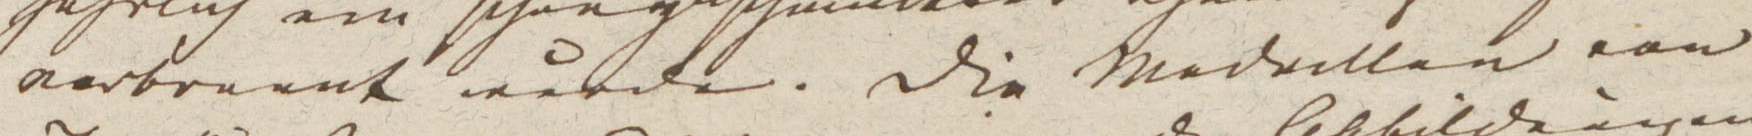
verbrannt wurde. Die Medaillen von
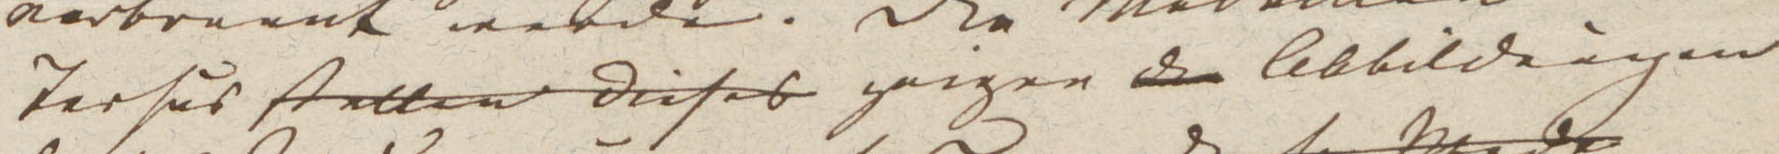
Tarsus stellen dieses zeigen die Abbildungen
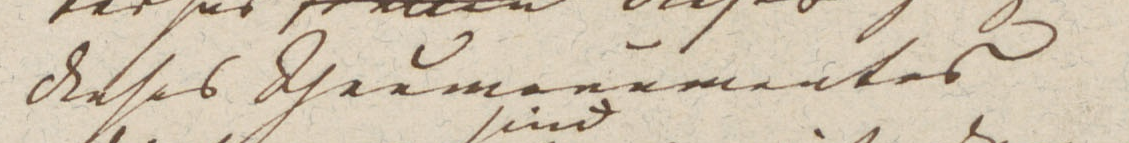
dieses Schaumonumentes
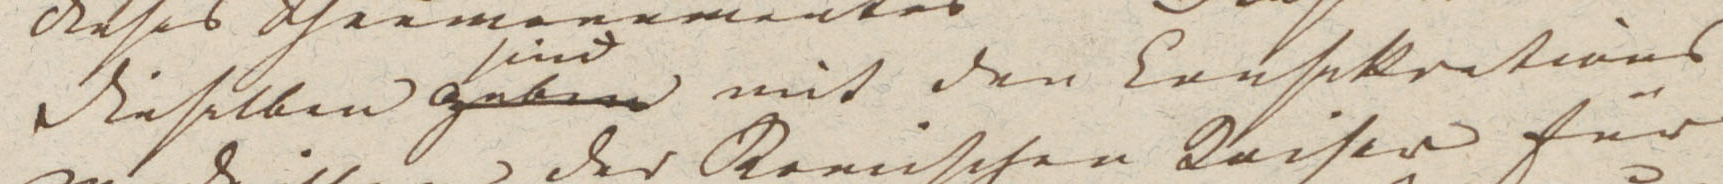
Dieselben geben sind mit den Consekrations-
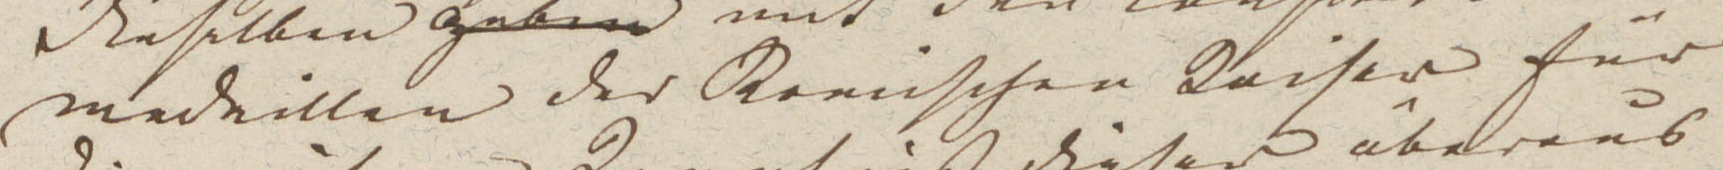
medaillen der Romischen Kaiser für
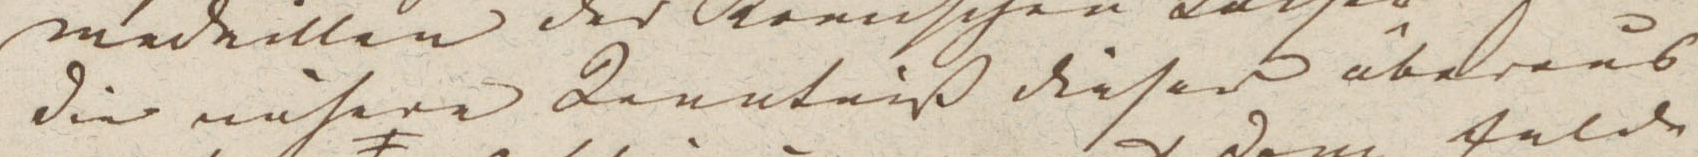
die nähere Kenntniss dieser überaus
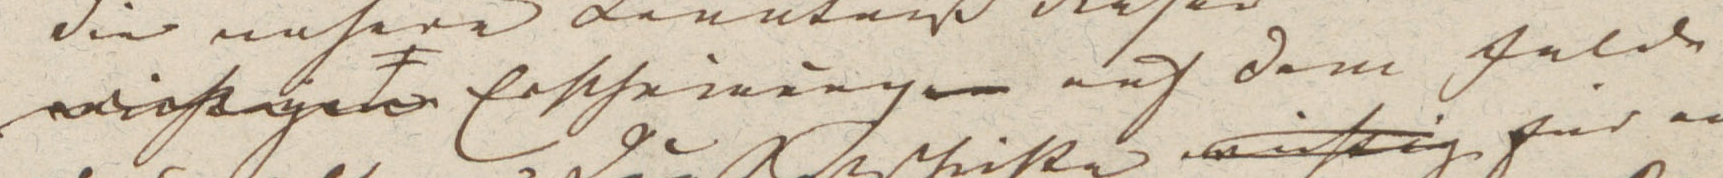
wichtigen % Erscheinungen auf dem Felde
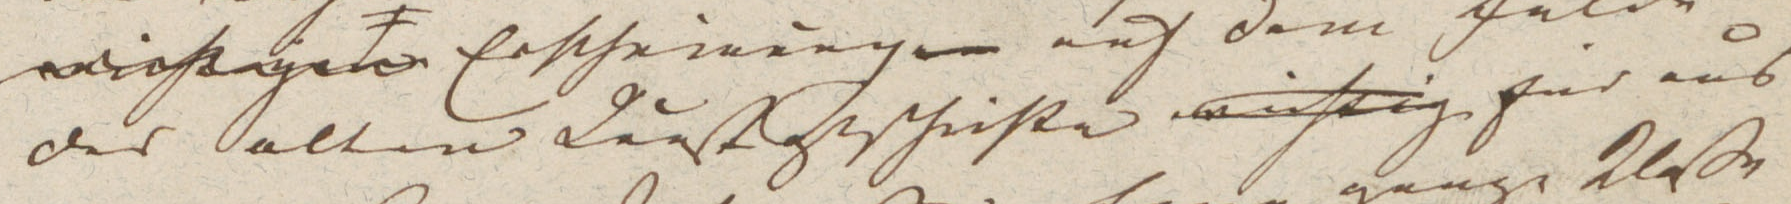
der alten Kunstgeschichte wichtig für uns
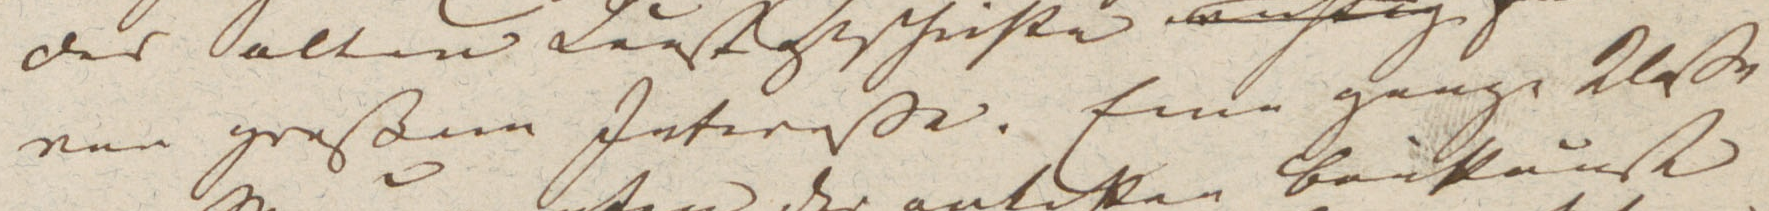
von grossem Interesse. Eine ganze Klasse
